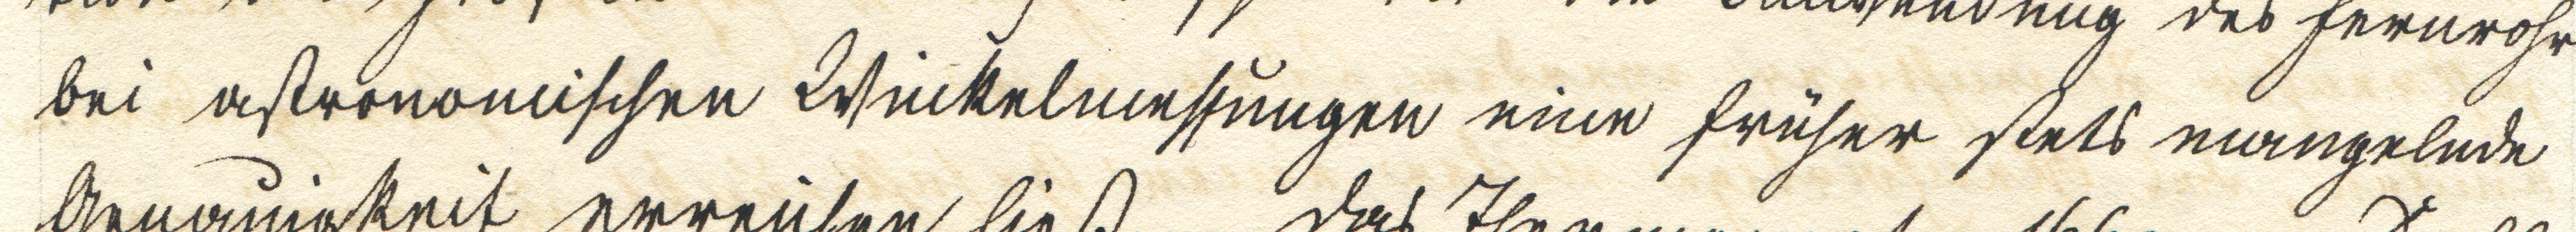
bei astronomischen Winckelmessungen eine früher stets mangelnde
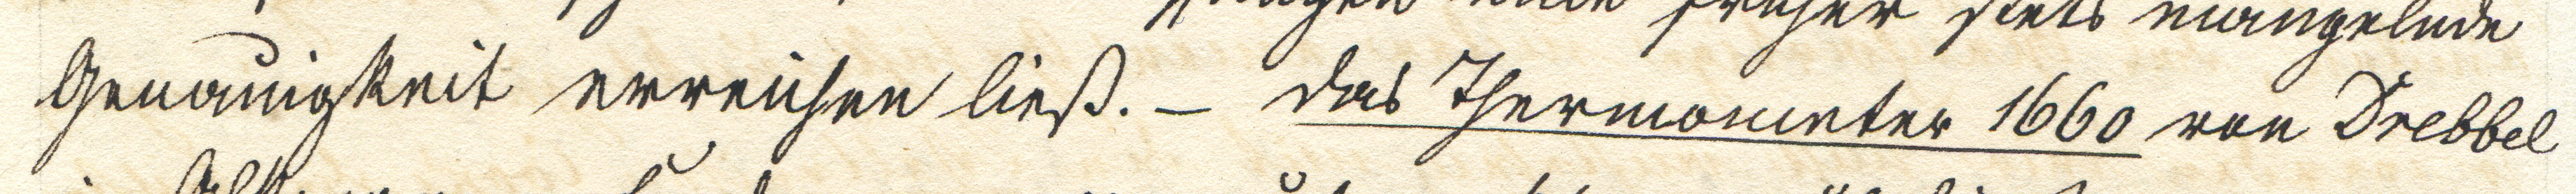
Genauigkeit erreichen ließ. – Das Thermometer 1660 von Drebbel
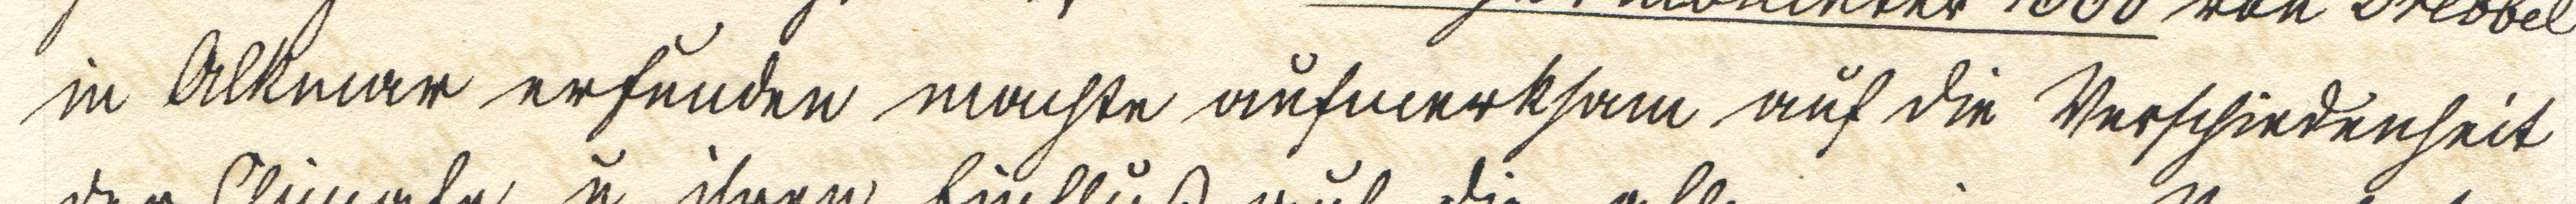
in Alkmar erfunden machte aufmerksam auf die Verschiedenheit
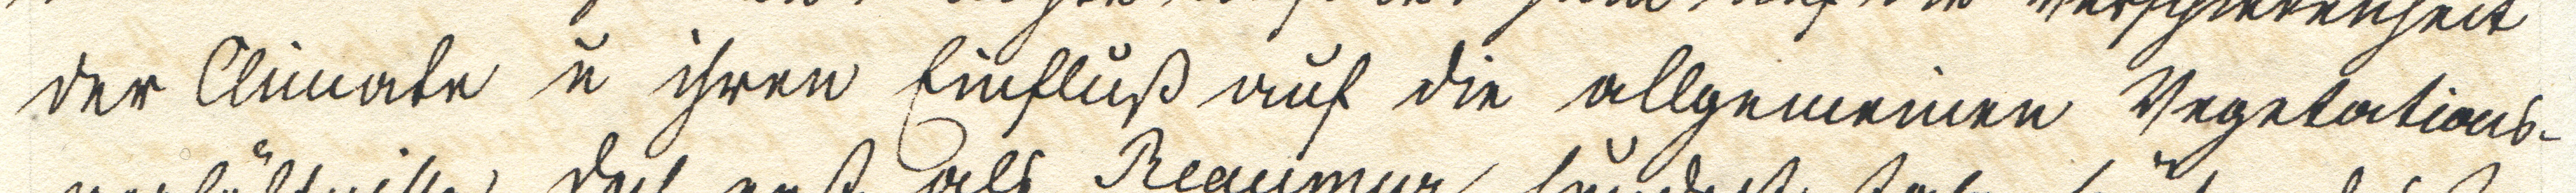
der Climate u ihren Einfluß auf die allgemeinen Vegetations-
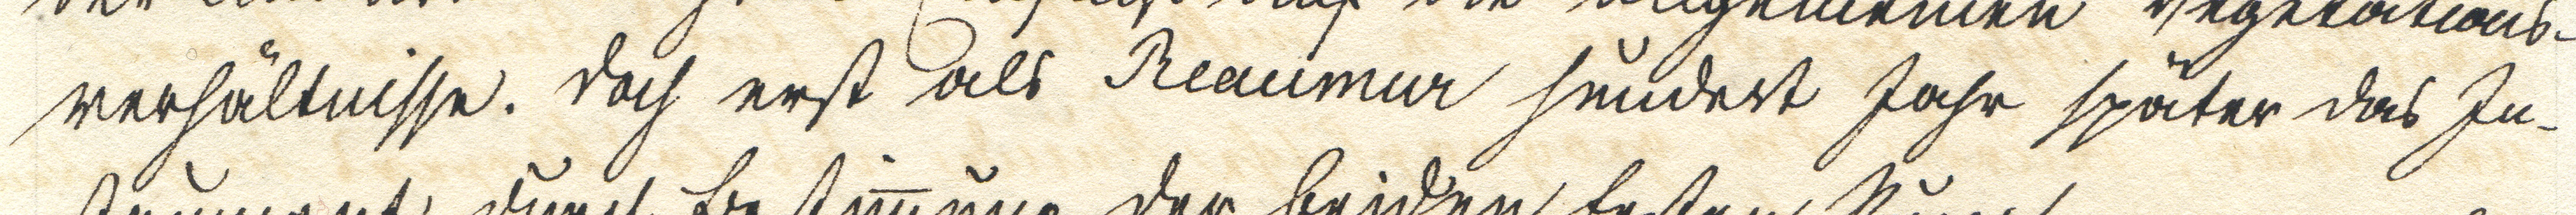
verhältnisse. Doch erst als Reaumur hundert Jahr später das In-
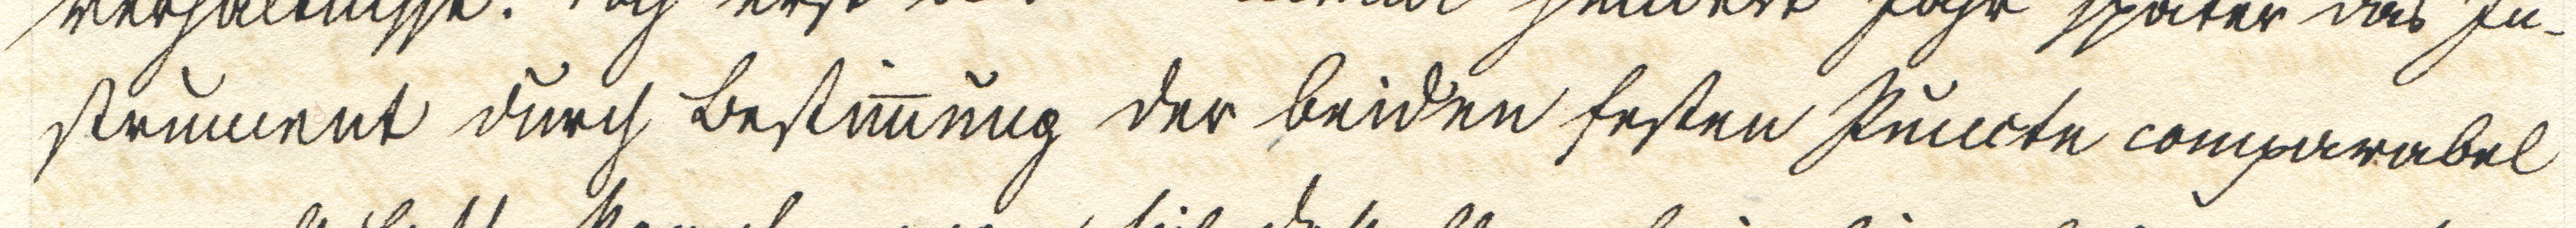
strument durch Bestim̃ung der beiden festen Puncte comparabel
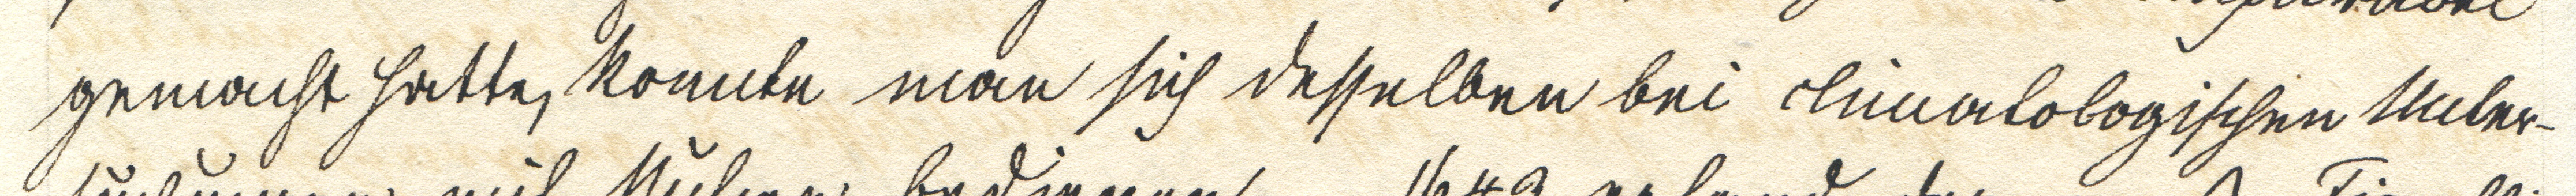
gemacht hatte, konnte man sich desselben bei climatologischen Unter-
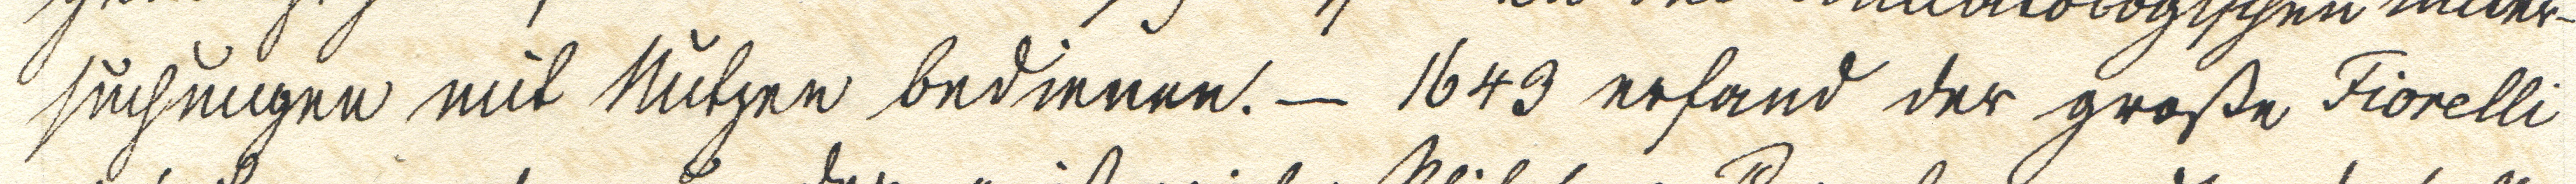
suchungen mit Nutzen bedienen. – 1643 erfand der große Fiorelli
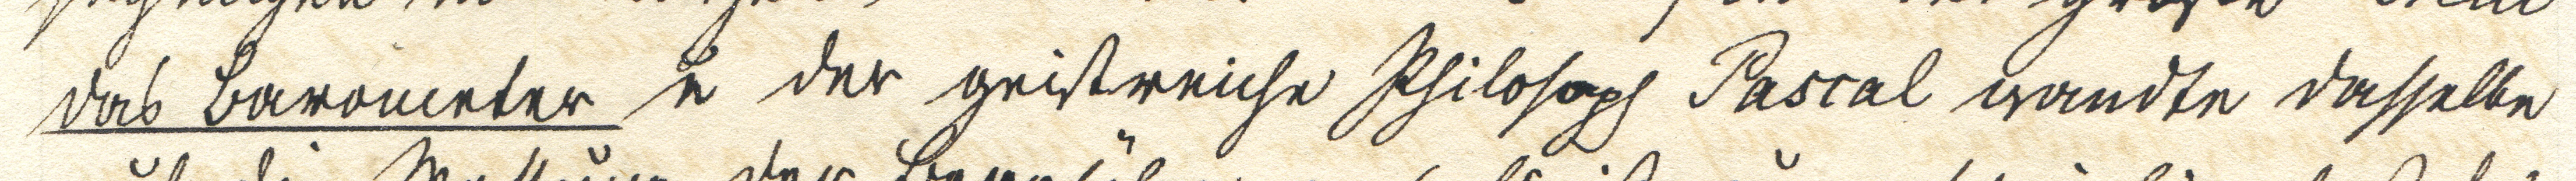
das Barometer u der geistreiche Philosoph Pascal wandte dasselbe
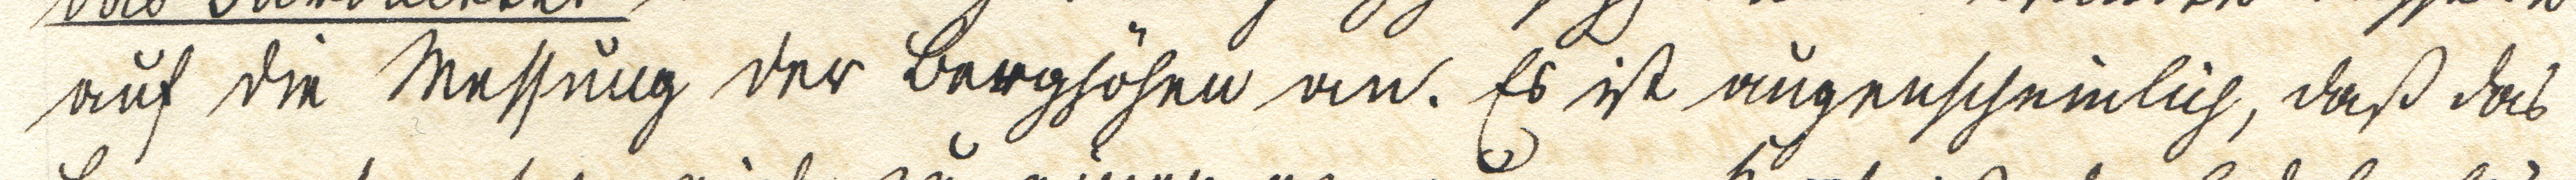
auf die Messung der Berghöhen an. Es ist augenscheinlich, daß das
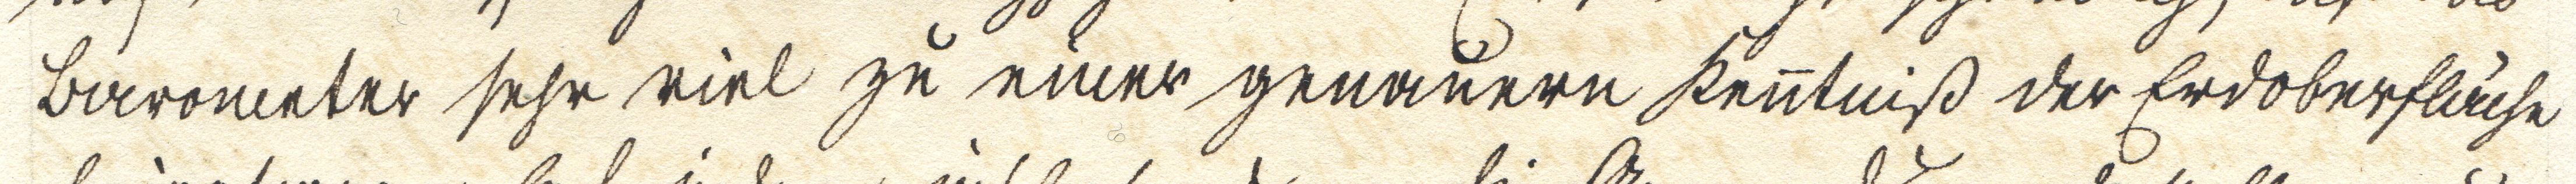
Barometer sehr viel zu einer genauern Keñtniß der Erdoberfläche
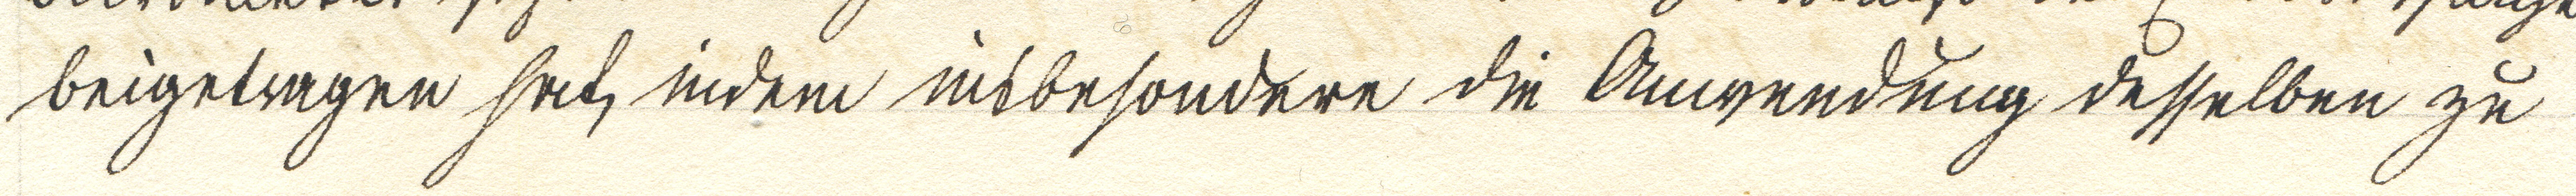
beigetragen hat, indem insbesondere die Anwendung desselben zu
